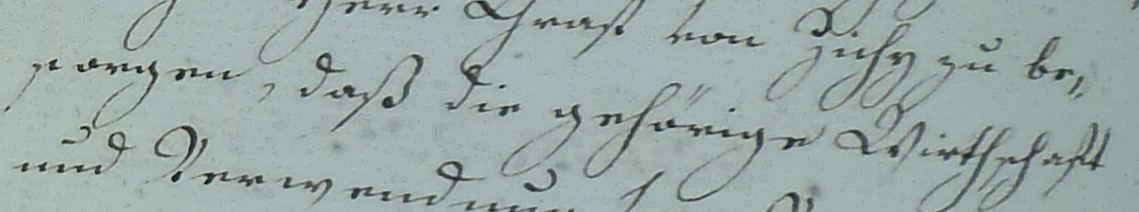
sorgen, daß die gehörige Wirtschaft
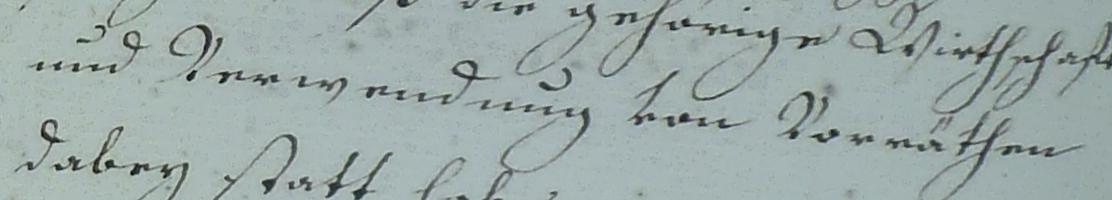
und Verwendung von Vorräthen
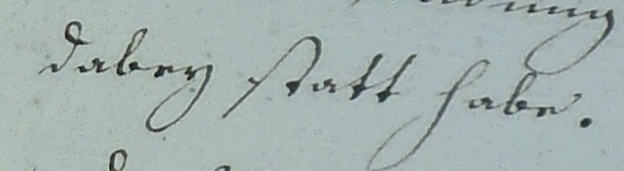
dabey statt habe.
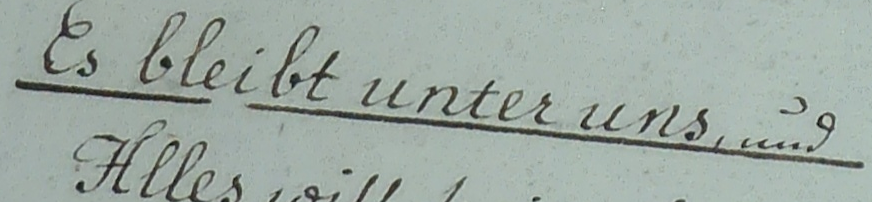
Es bleibt unter uns, und
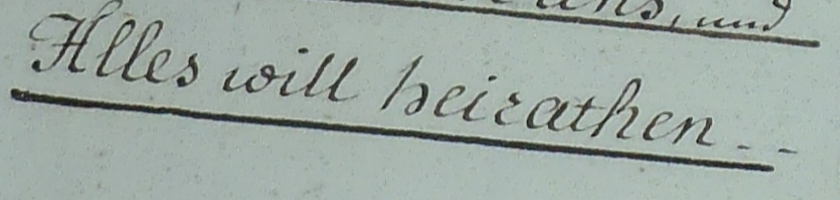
Alles will heirathen ..
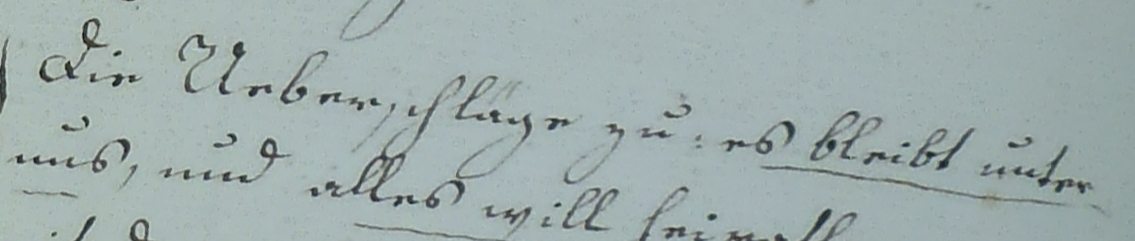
Die Ueberschläge zu : es bleibt unter
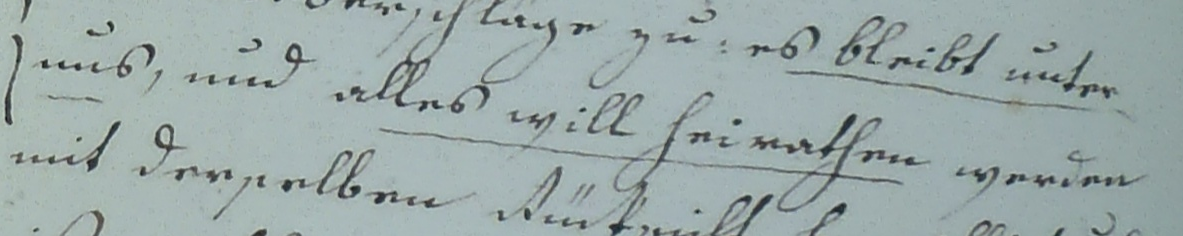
uns, und alles will heirathen werden
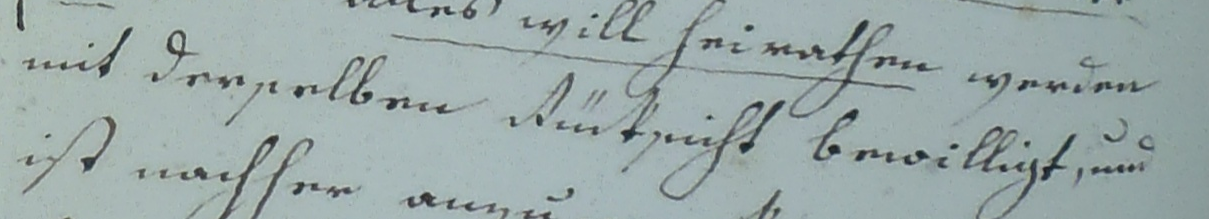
mit derselben Rücksicht bewilligt, und
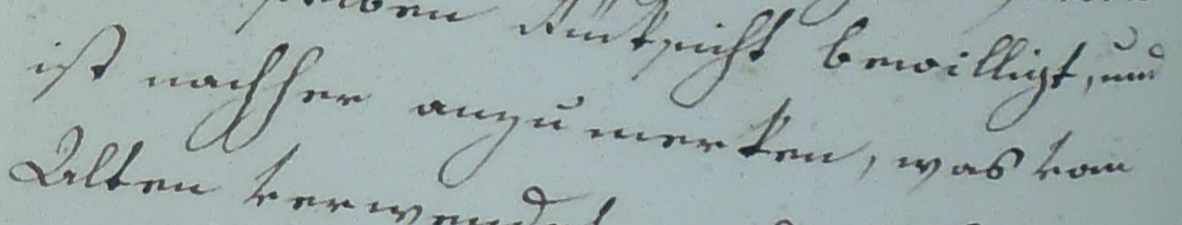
ist nachher anzumerken, was vom
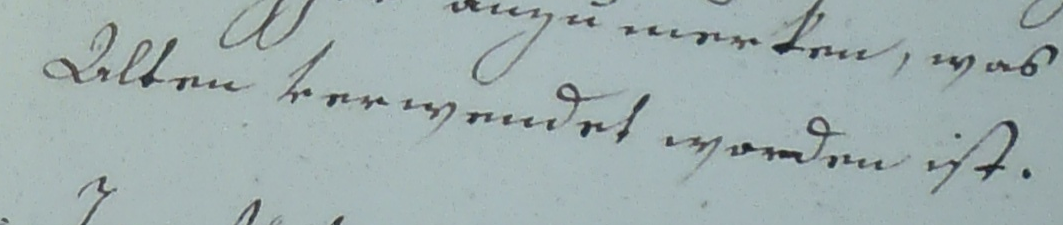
Alten verwendet worden ist.
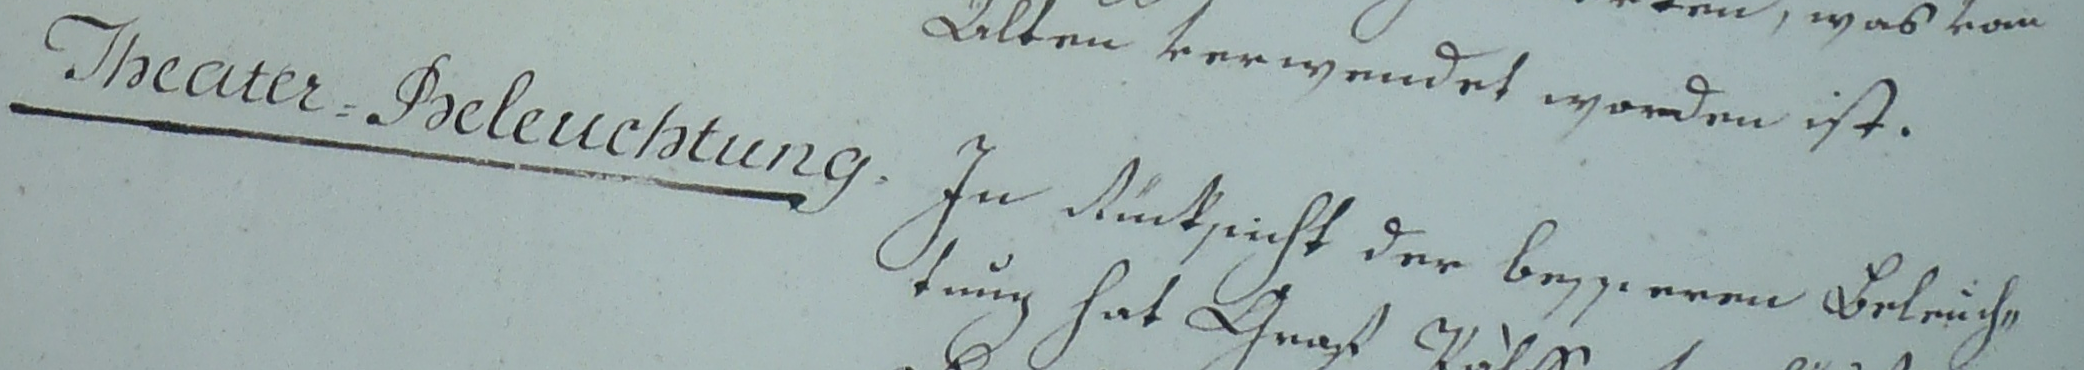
Theater‗Beleuchtung. In Rücksicht der besseren Beleuch¬
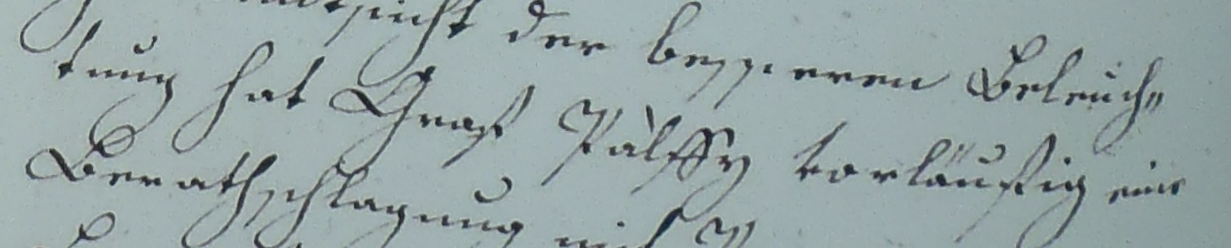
tung hat Graf Pàlffy vorläufig eine
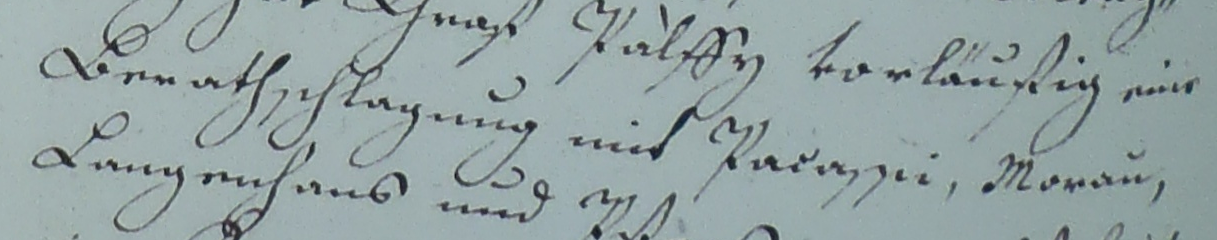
Berathschlagung mit Pacassi, Morau,
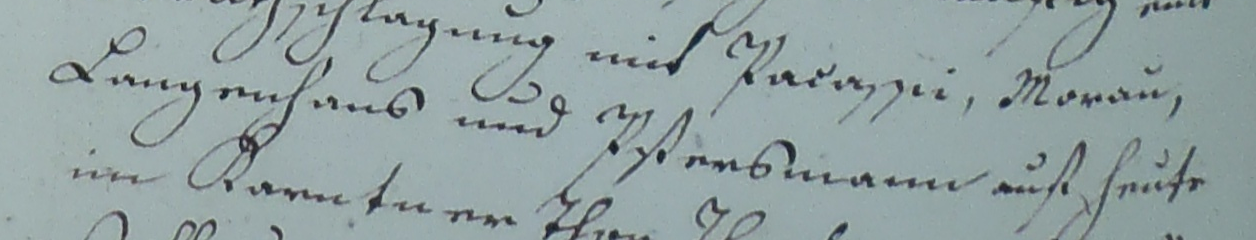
Langenhans und Pfersmann auf heute
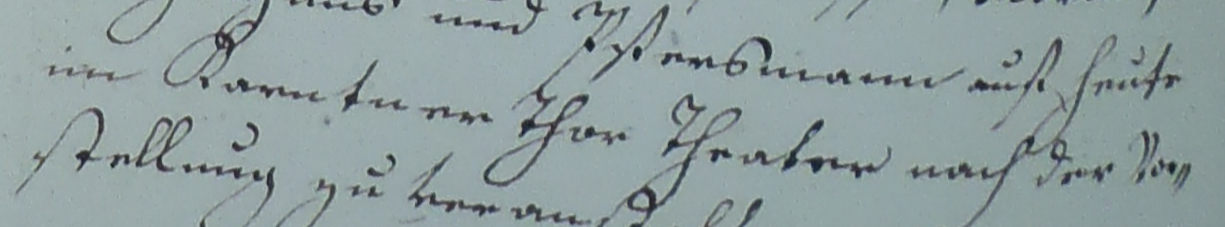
im Karntner Thor Theater nach der Vor¬
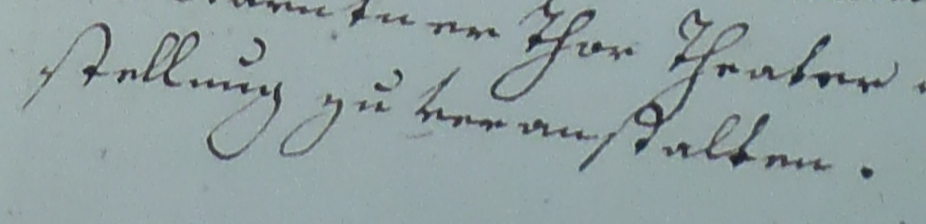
stellung zu veranstalten.
